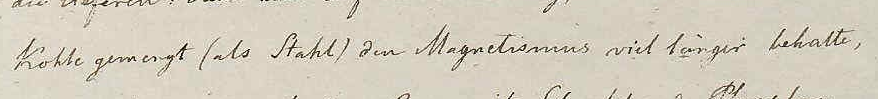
Kohle gemengt den Magnetismus viel länger behalte,
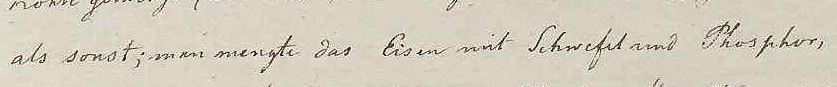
als sonst; man mengte das Eisen mit Schwefel und Phosphor,
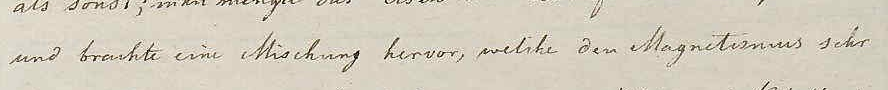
und brachte eine Mischung hervor, welche den Magnetismus sehr
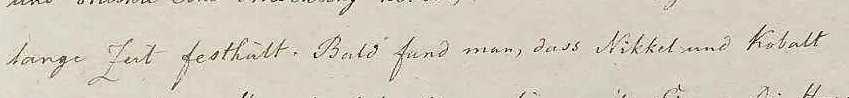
lange Zeit festhält. Bald fand man, dass Nikkel und Kobalt
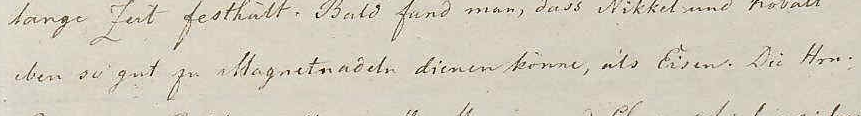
eben so gut zu Magnetnadeln dienen könne, als Eisen. Die Hrn.
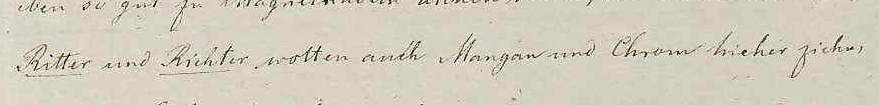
Ritter und Richter wolten auch Mangan und Chrom hieher ziehn,
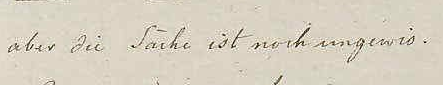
aber die Sache ist noch ungewis.
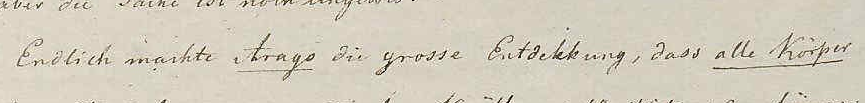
Endlich machte Arago die grosse Entdekkung, dass alle Körper
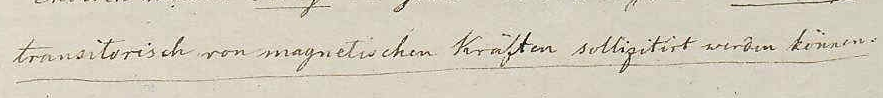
transitorisch von magnetischen Kräften sollizitirt werden können:
